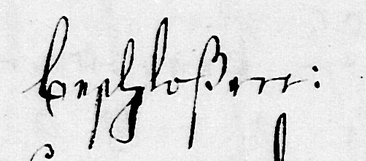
beschloßen:
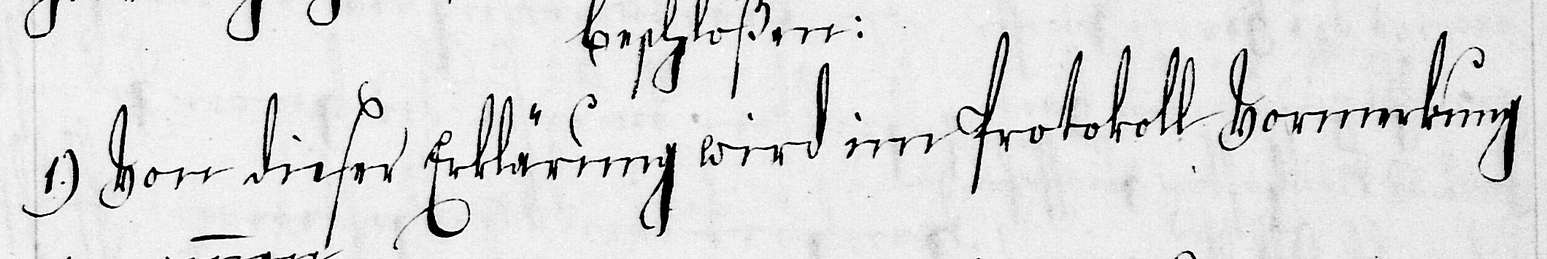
1.) Von dieser Erklärung wird im Protokoll Vormerkung
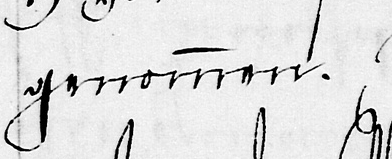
genommen.
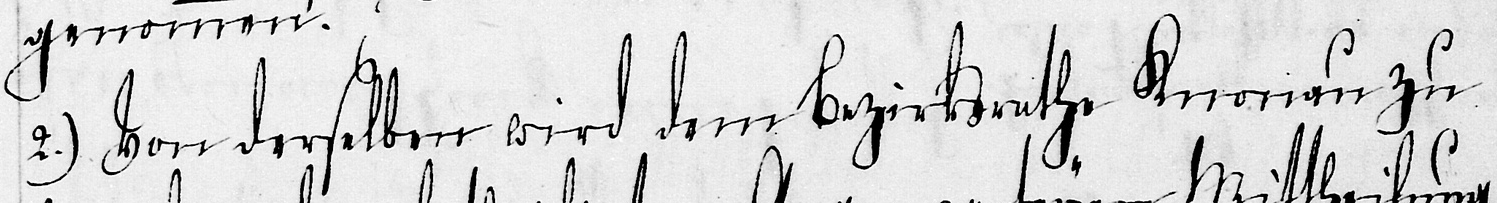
2.) Von derselben wird dem Bezirksrathe Knonau zu
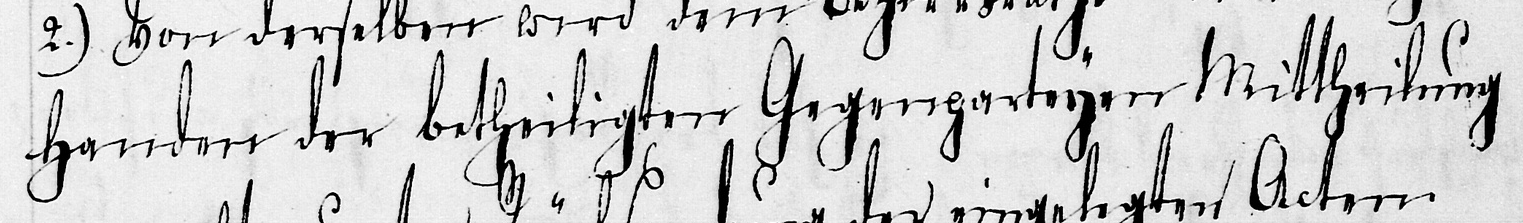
Handen der betheiligten Gegenparteyen Mittheilung
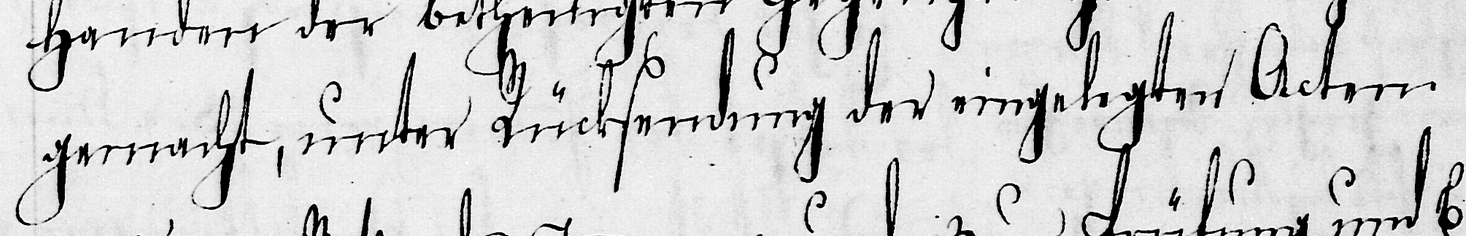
gemacht, unter Rücksendung der eingelegten Acten.
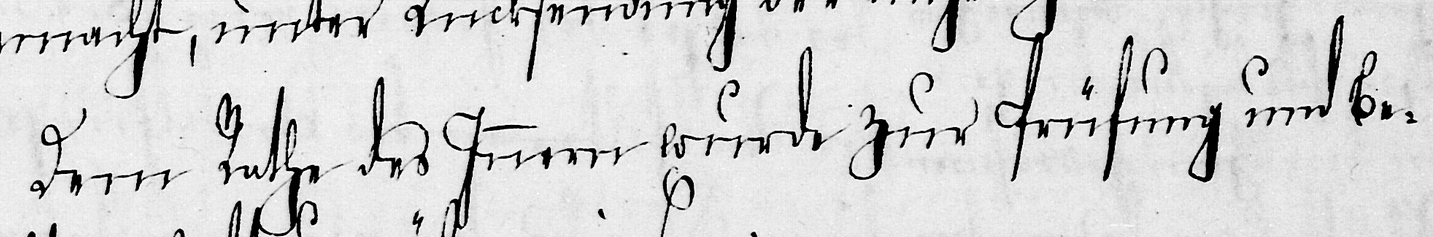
Dem Rathe des Innern wurde zur Prüfung und Be¬
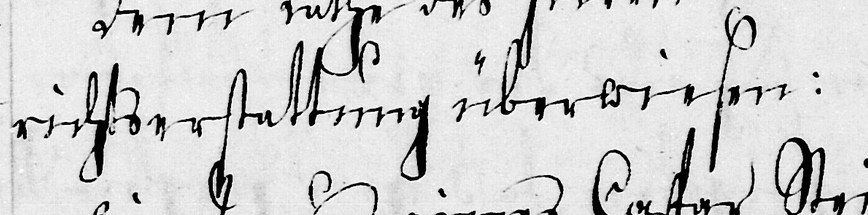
richtserstattung überwiesen:
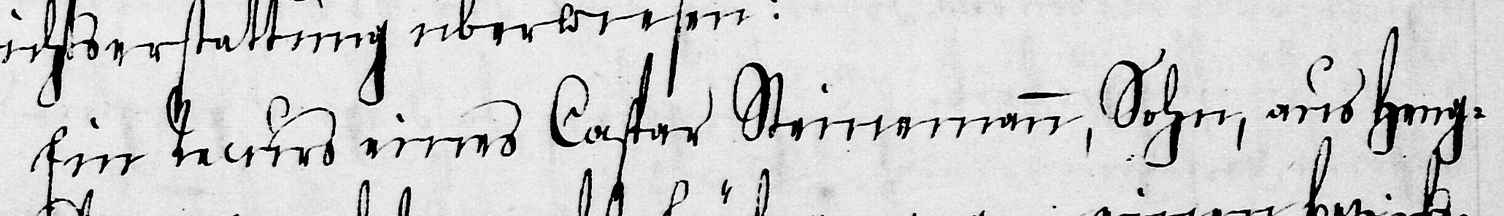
Ein Recurs eines Caspar Steinemann, Sohn, aus Heng¬
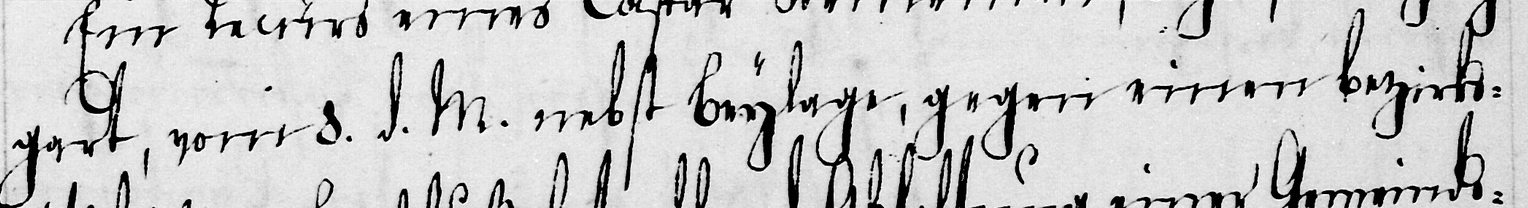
gart, vom 8. d. M. nebst Beylage, gegen einen bezirks¬
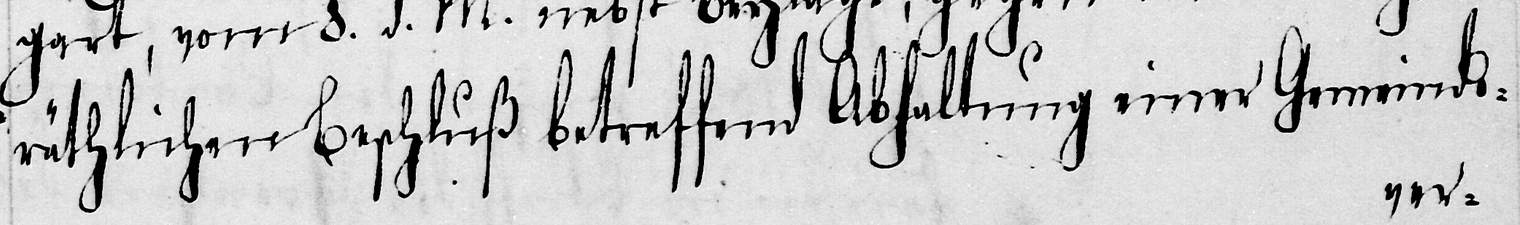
räthlichen Beschluß betreffend Abhaltung einer Gemeinds-
